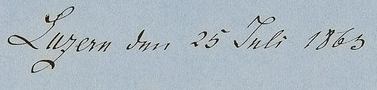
Luzern den 25 Juli 1863
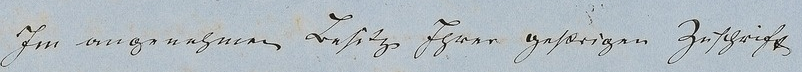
Im angenehmen Besitze Ihrer gestrigen Zuschrift
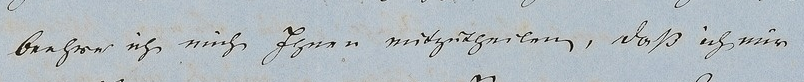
beehre ich mich Ihnen mitzutheilen, daß ich mir
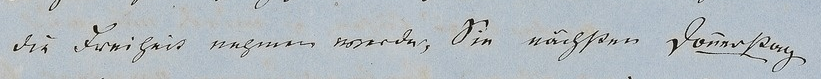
die Freiheit nehmen werde, sie nächsten Donnerstag
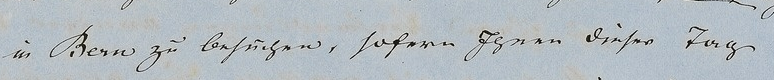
in Bern zu besuchen, sofern Ihnen dieser Tag
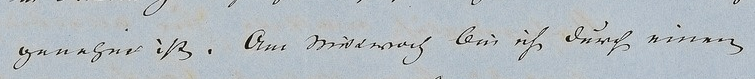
genehm ist. Am Mittwoch bin ich durch einen
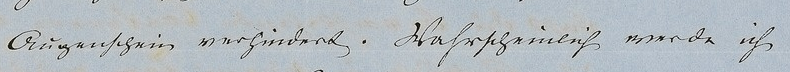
Augenschein verhindert. Wahrscheinlich werde ich
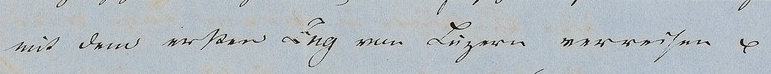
mit dem ersten Zug von Luzern verreisen &
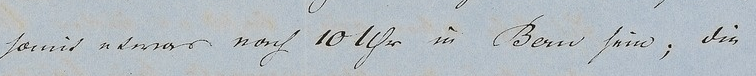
somit etwas nach 10 Uhr in Bern sein; die
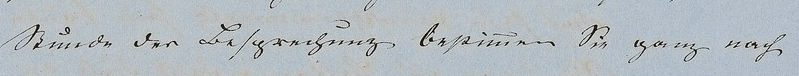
Stunde der Besprechung bestimmen Sie ganz nach
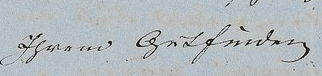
Ihrem Gutfinden.
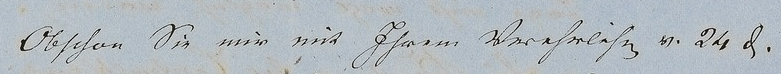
Obschon Sie mir mit Ihrem Verehrlichen v. 24 ds.
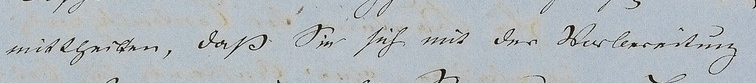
mittheilten, daß Sie sich mit der Vorbereitung
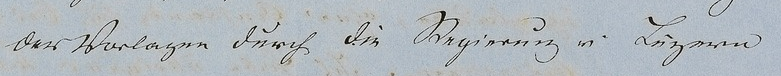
der Vorlagen durch die Regierung v. Luzern
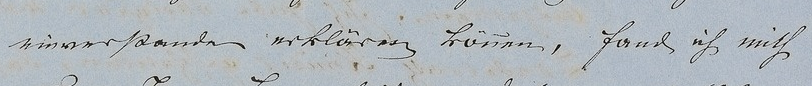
einverstanden erklären können, fand ich mich
